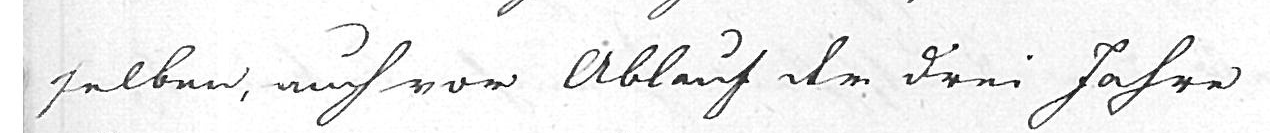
selben, auch vor Ablauf der drei Jahre
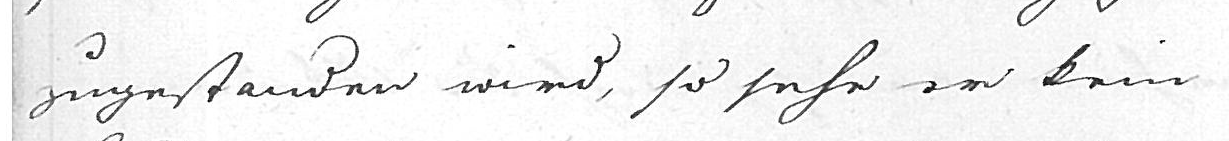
zugestanden wird, so sehe er kein
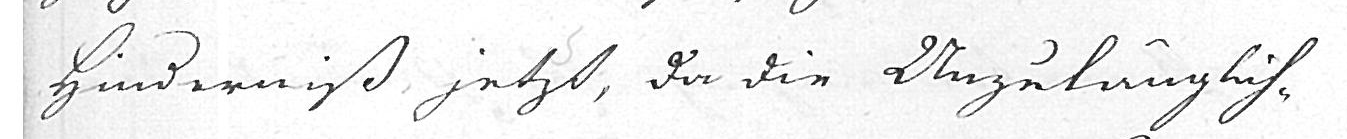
Hinderniß jetzt, da die Unzulänglich-
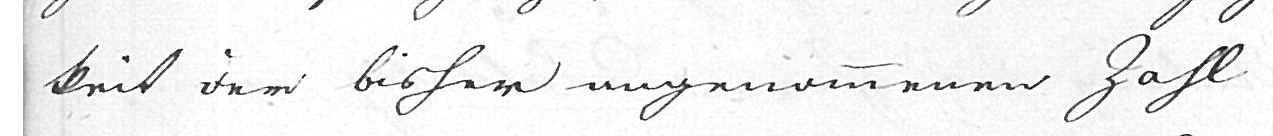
keit der bisher angenommenen Zahl
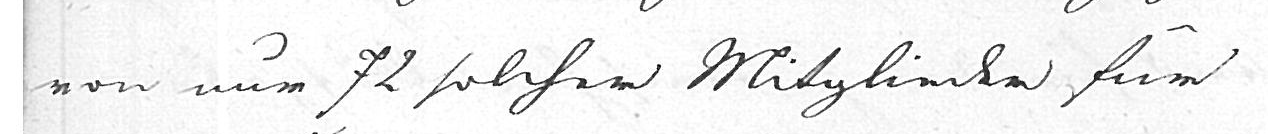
von nur 72 solcher Mitglieder für
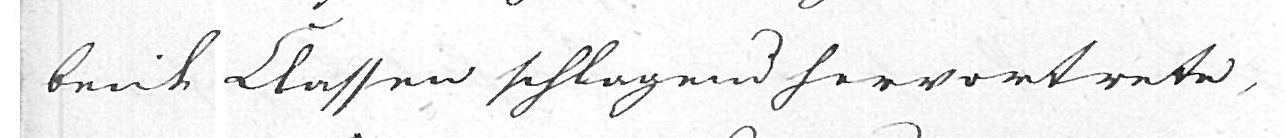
beide Classen schlagend hervortrete,
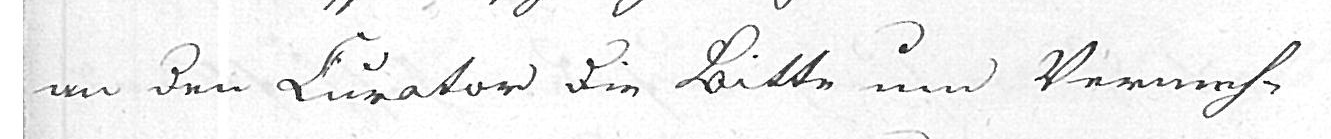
an den Curator die Bitte um Vermeh-
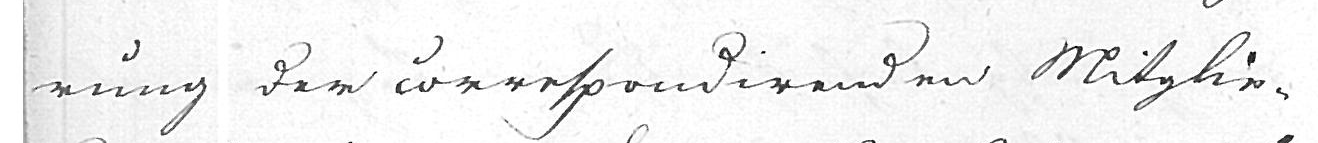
rung der corrspondirenden Mitglie-
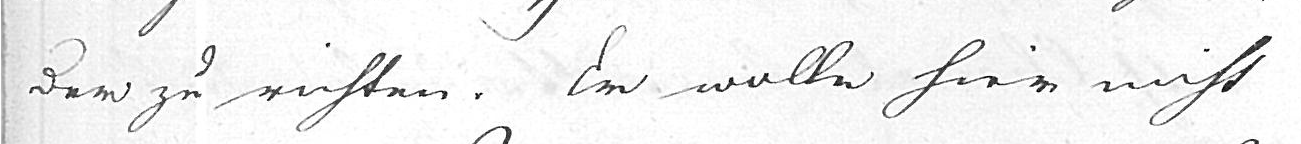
der zu richten. Er wolle hier nicht
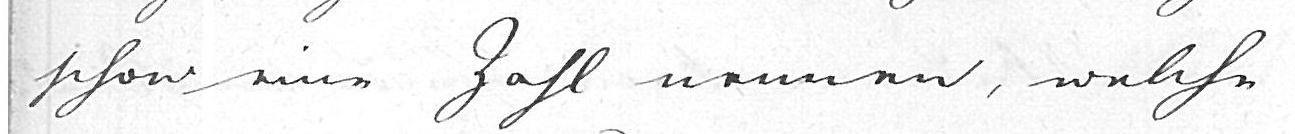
schon eine Zahl nennen, welche
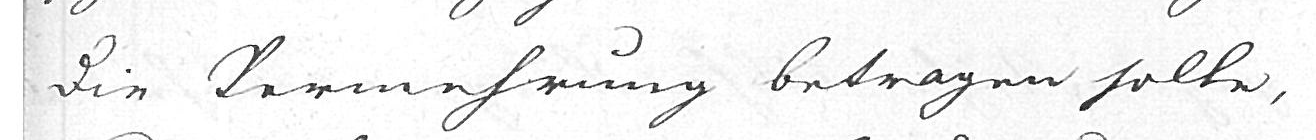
die Vermehrung betragen solle,
